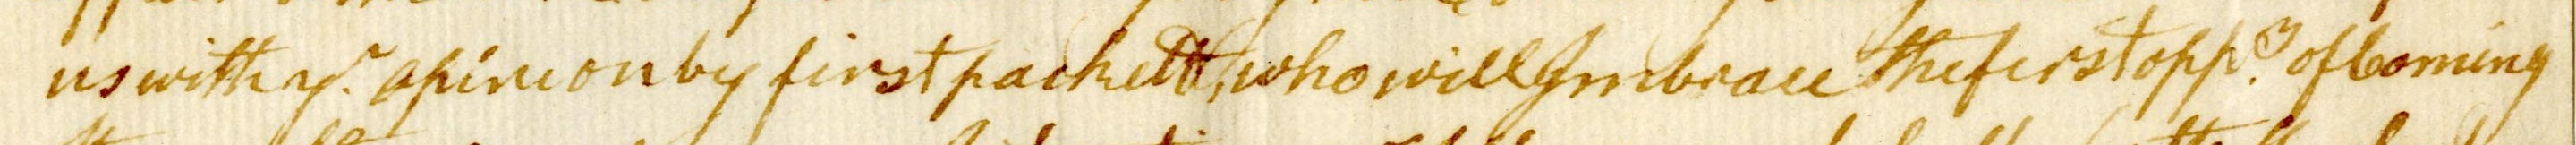us with y^r. opinion first packett, who will embrace thes first opp^y. of Coming
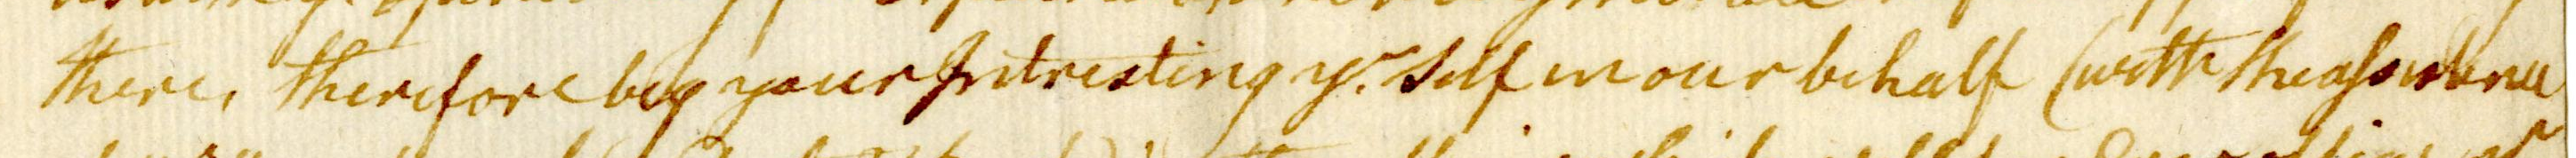there, therefore beg your Intresting y^r.self in our behalf (with the assurance
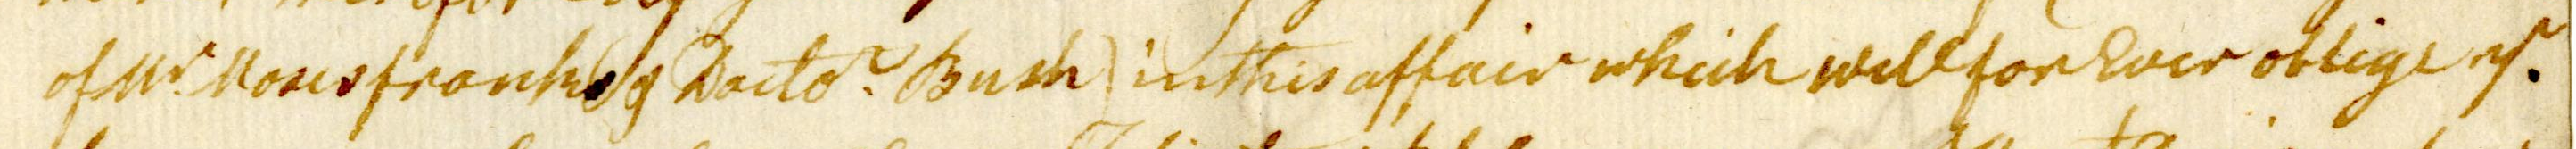of M^r Moses franks g Docto^r. Bush in this affair which will for Ever oblige y^r.
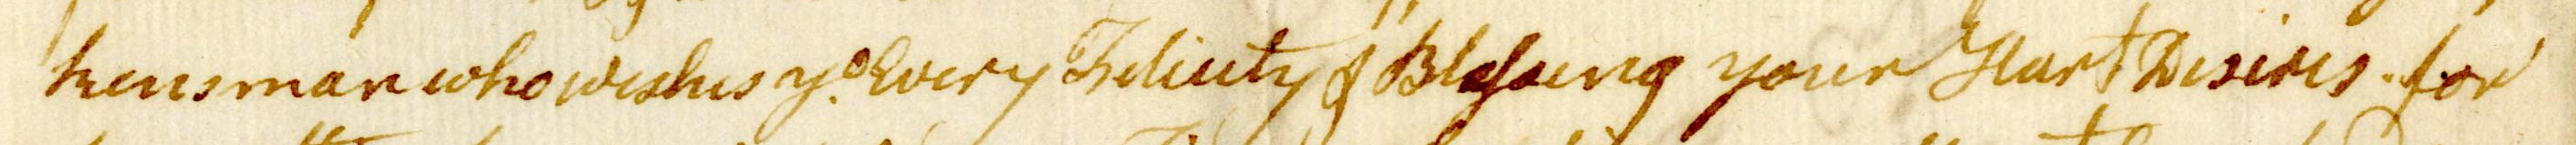kinsman who wishes y^e. every Felicity of Blessing your Hart Desires for
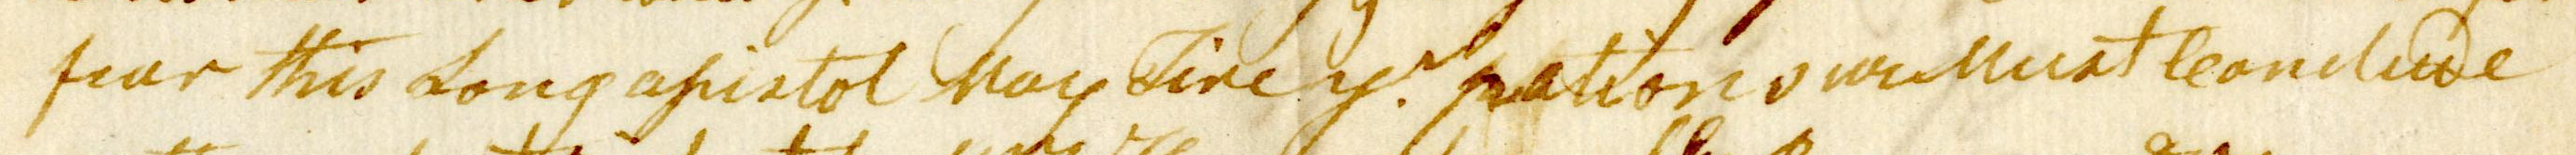fear this Long apistol may Tire y^r. patience must conclude
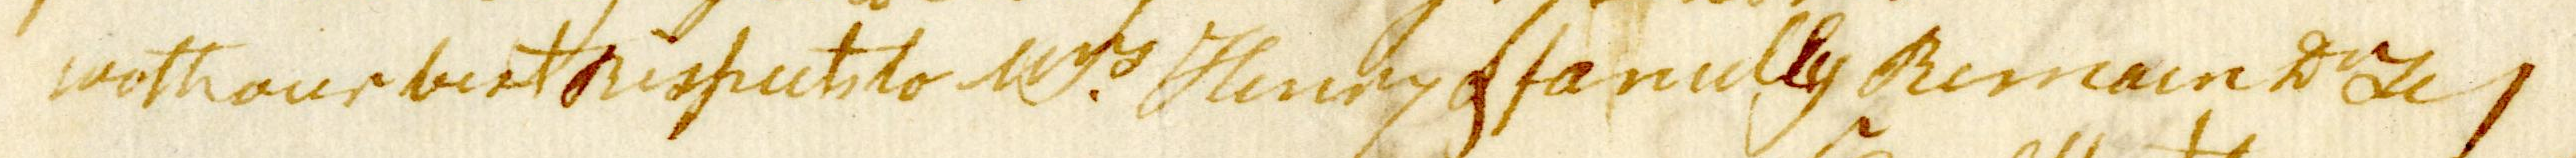with our best Rispects to M^rs. Henry & familly Remain D^r Sr
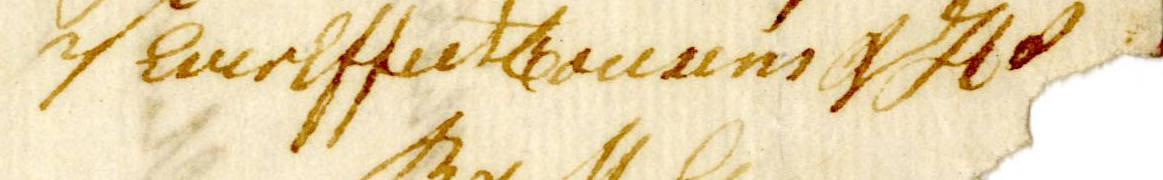Y^r ever Effect & Cousin & Hl^e
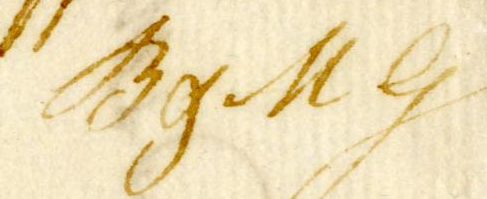BgMG
